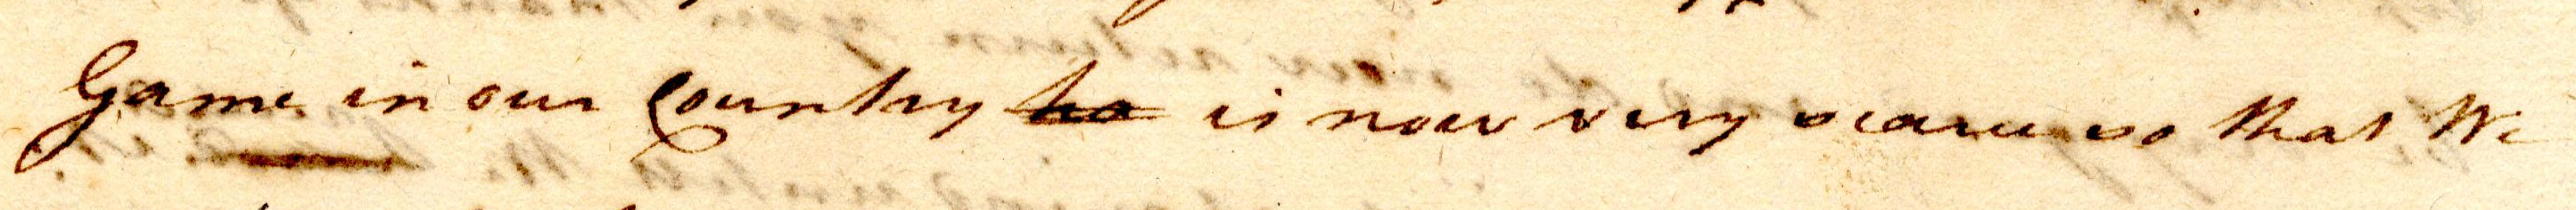Game in our Country is now very scarce so that We
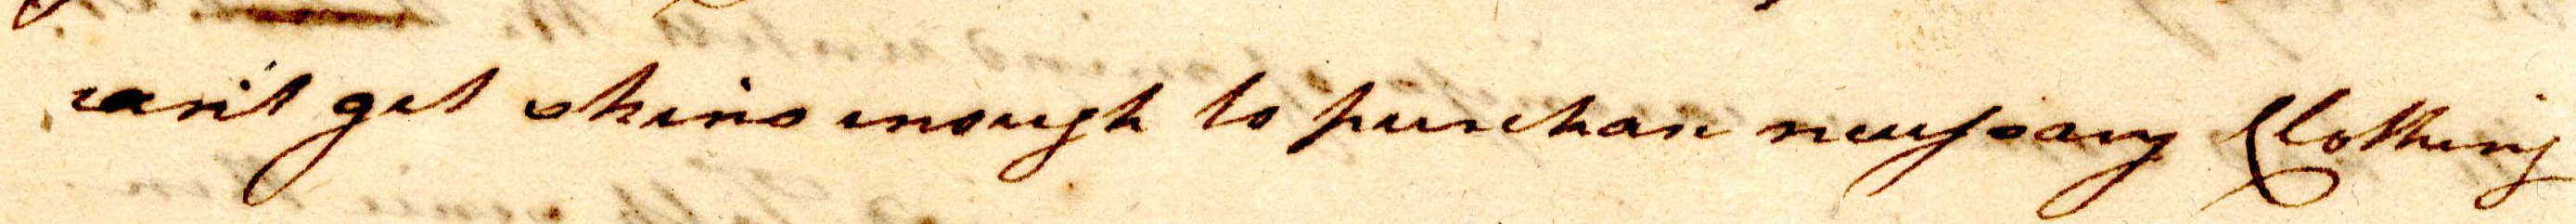can't get skins enough to purchase necessary Clothing
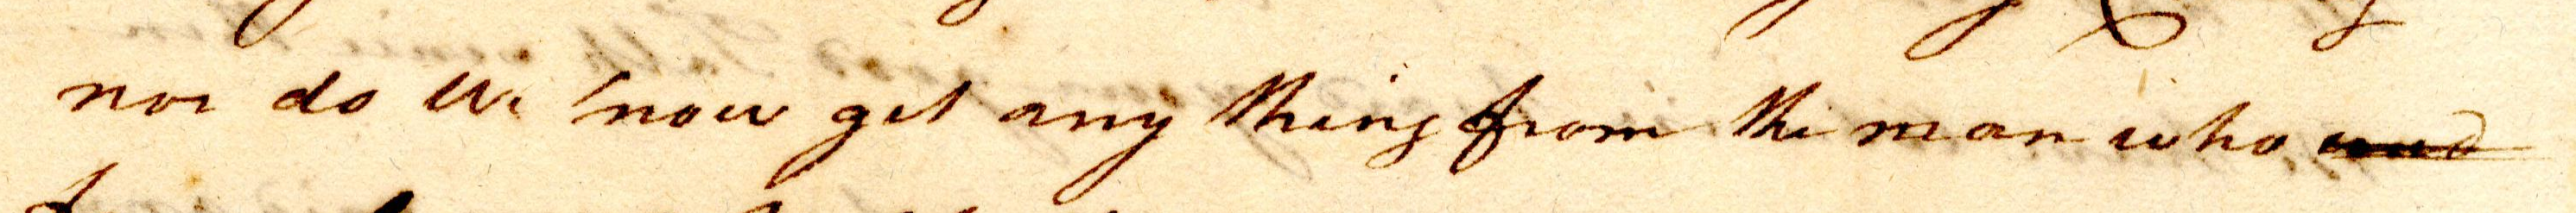nor do We now get any thing from the man who and
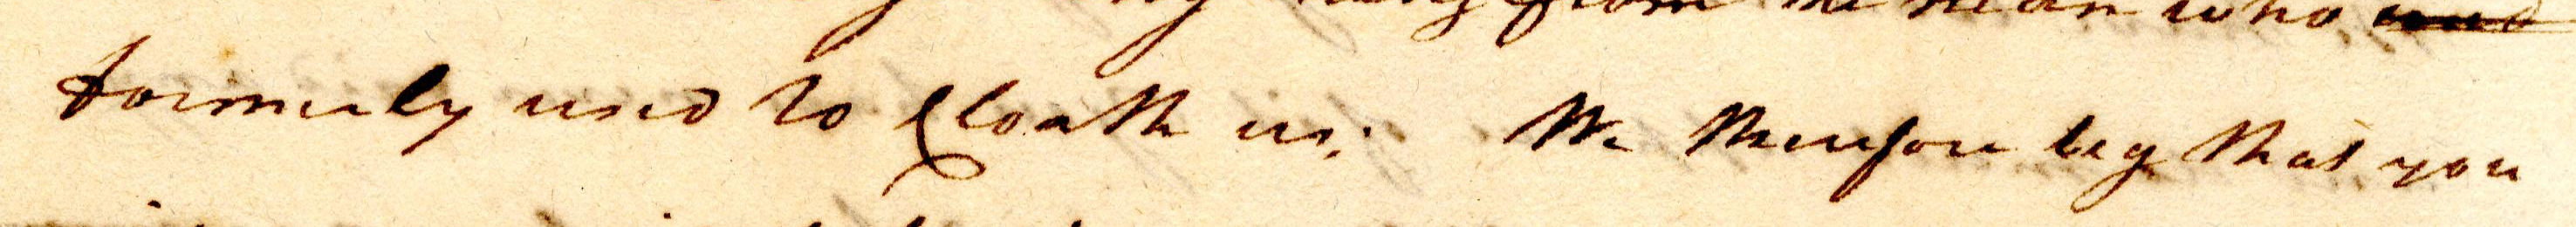Formerly used to Cloath us. We therefore beg that you
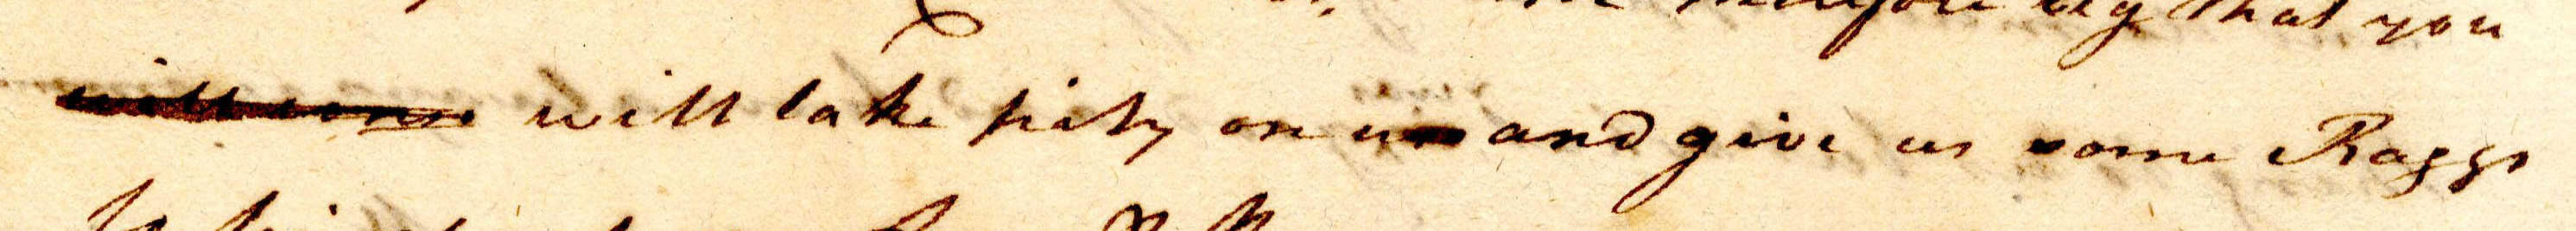[_______] will take pity on us and give us some Raggs
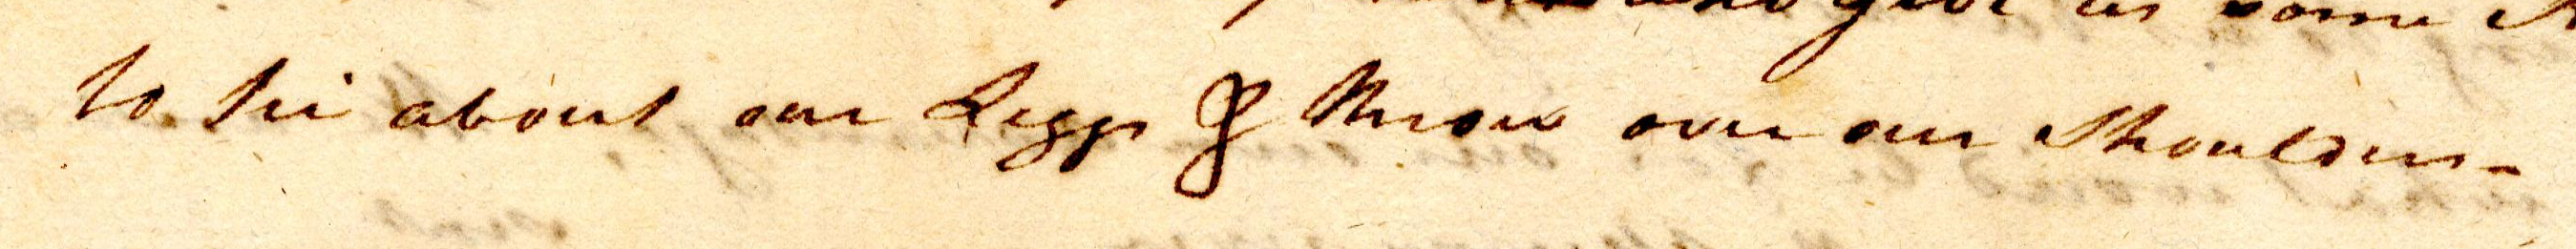to sit about our Leggs & throw over our Shoulders.
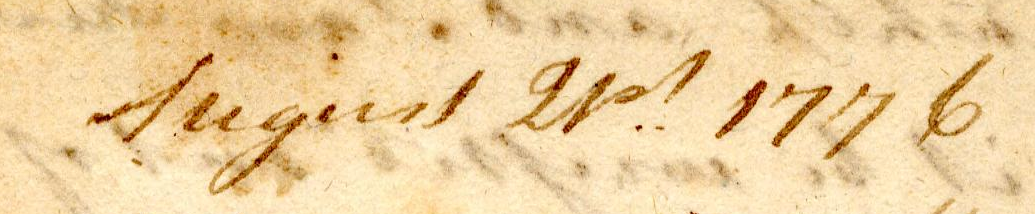August 21^st. 1776
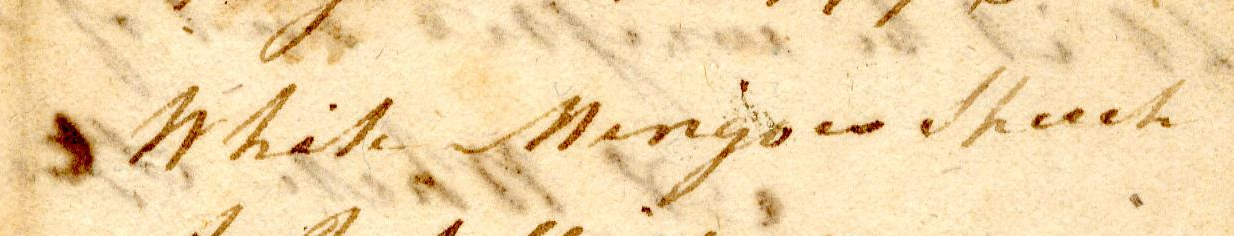White Mingoes Speech
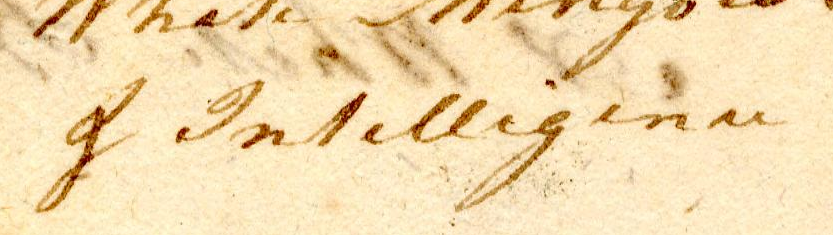& Intelligince
